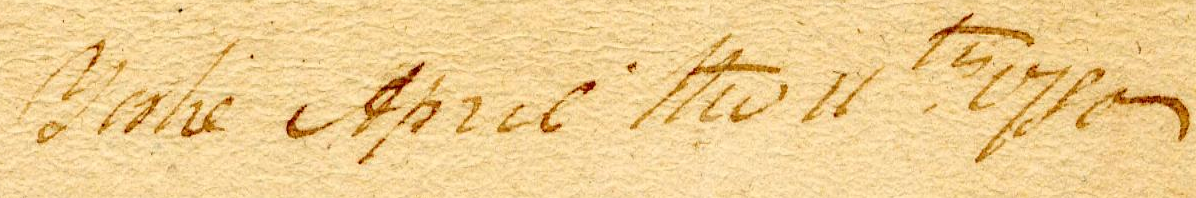Yorke April the 11^th. 1780
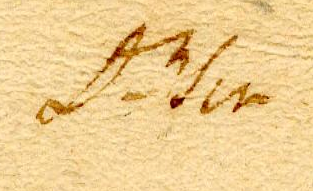D^r Sir
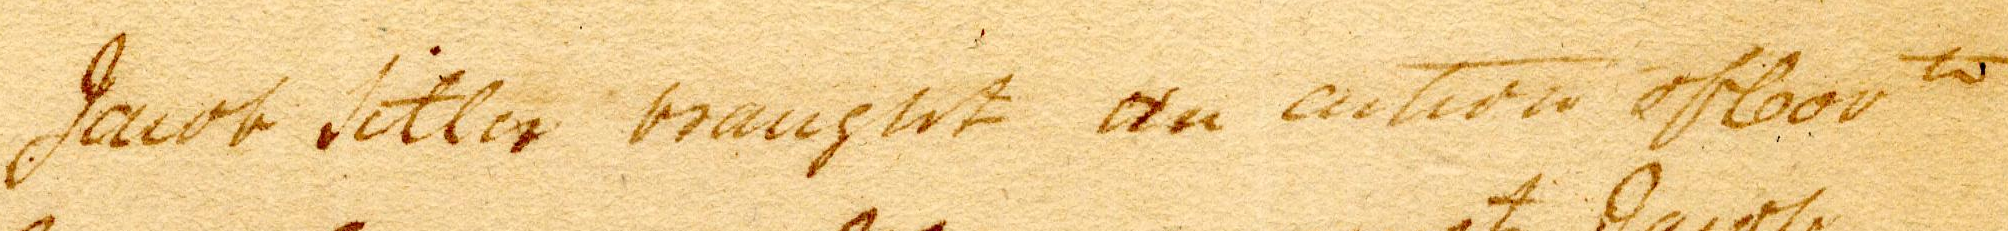Jacob Setler brought an action of Cov^t
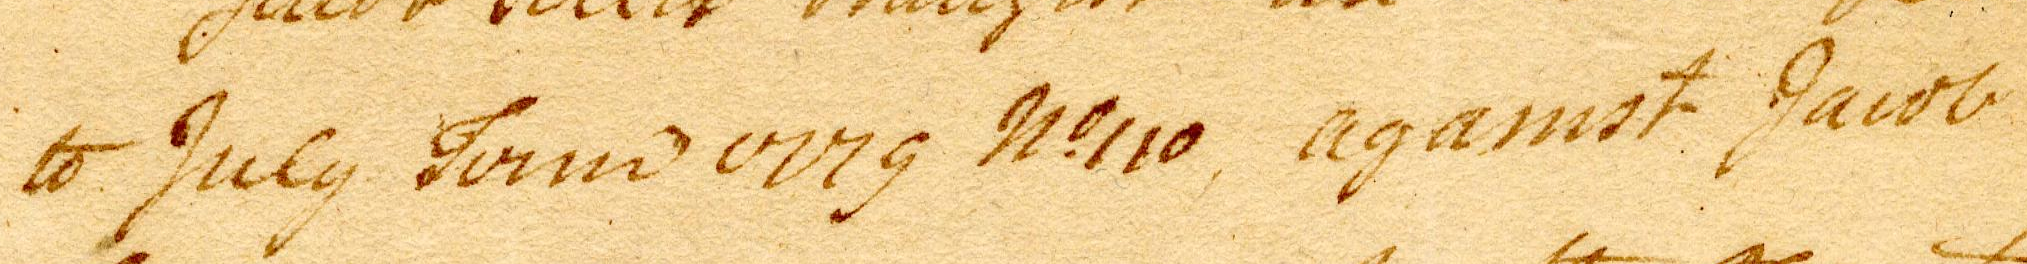to July Turm 1779 N^o. 110 against Jacob
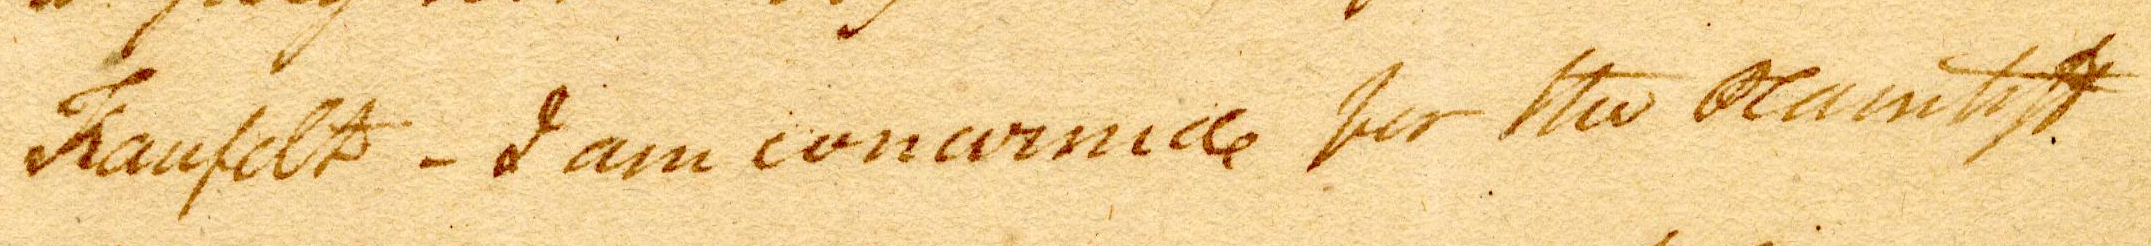Kaufelt. I am concerned for the Ocamtest
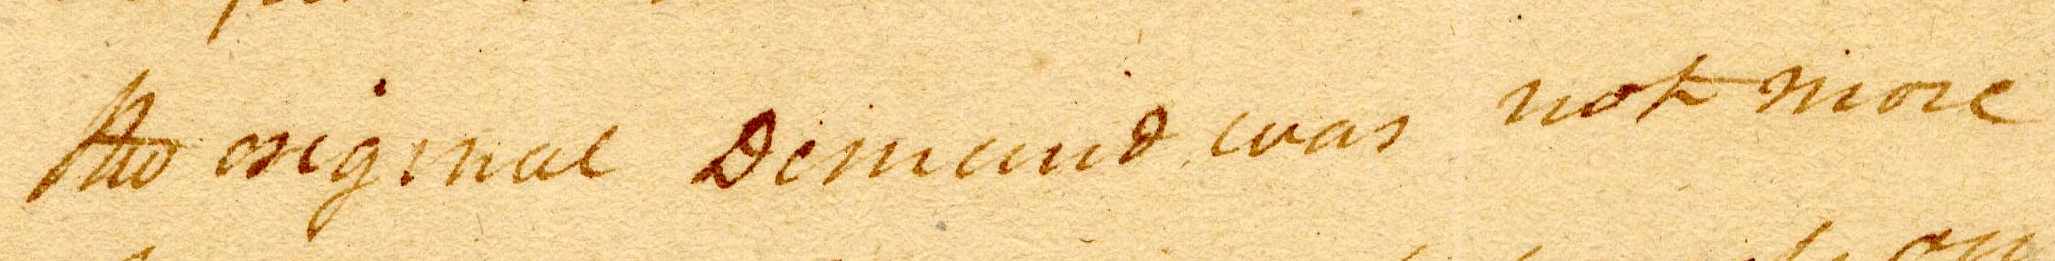to original Demand was not more
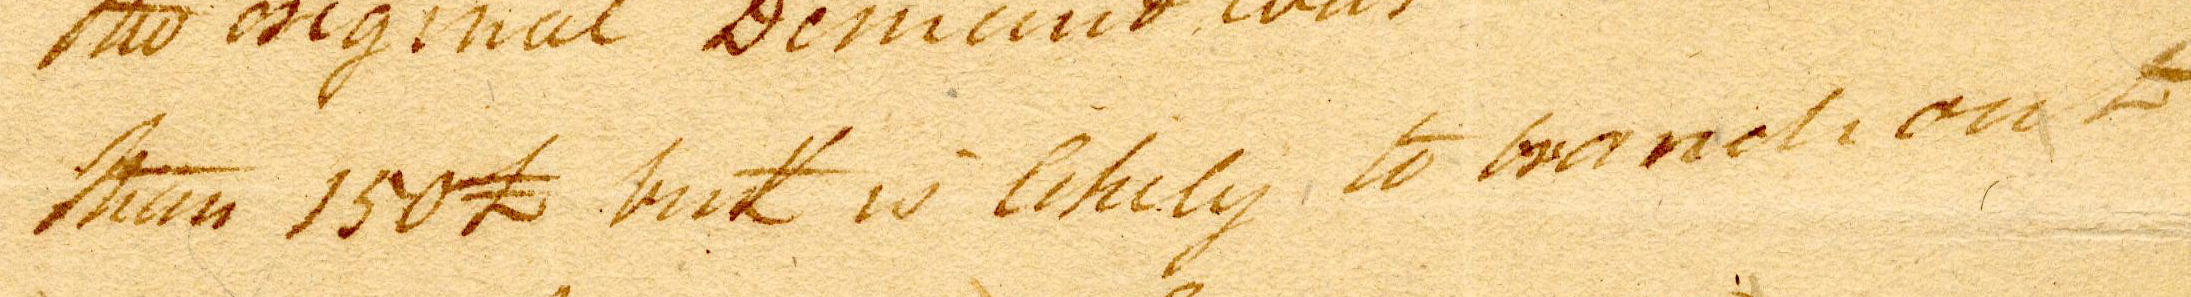then 150£ but is likely to branch out
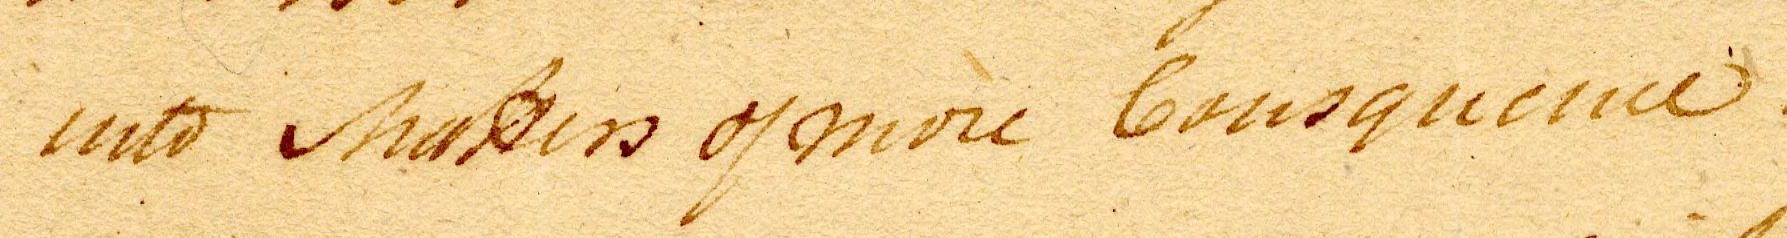into Shapers of more Consquence
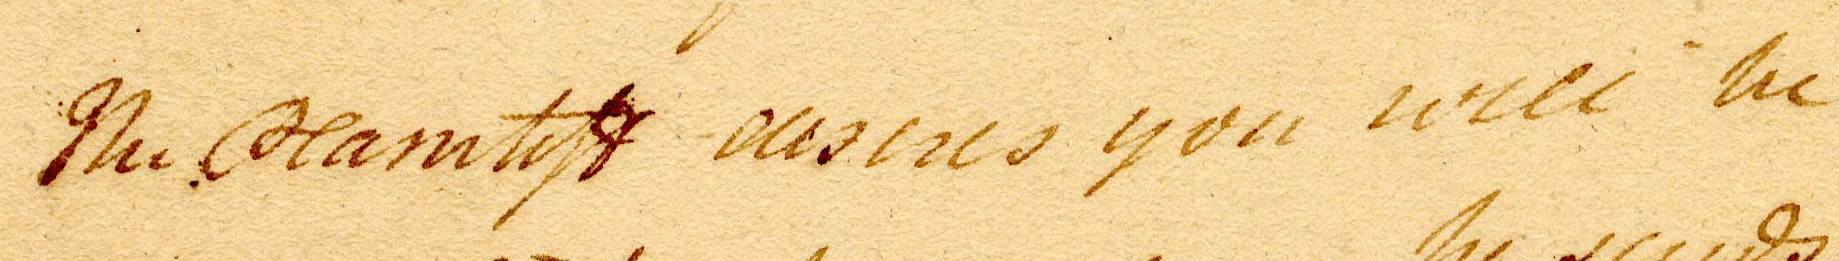The Calamity desires you will be
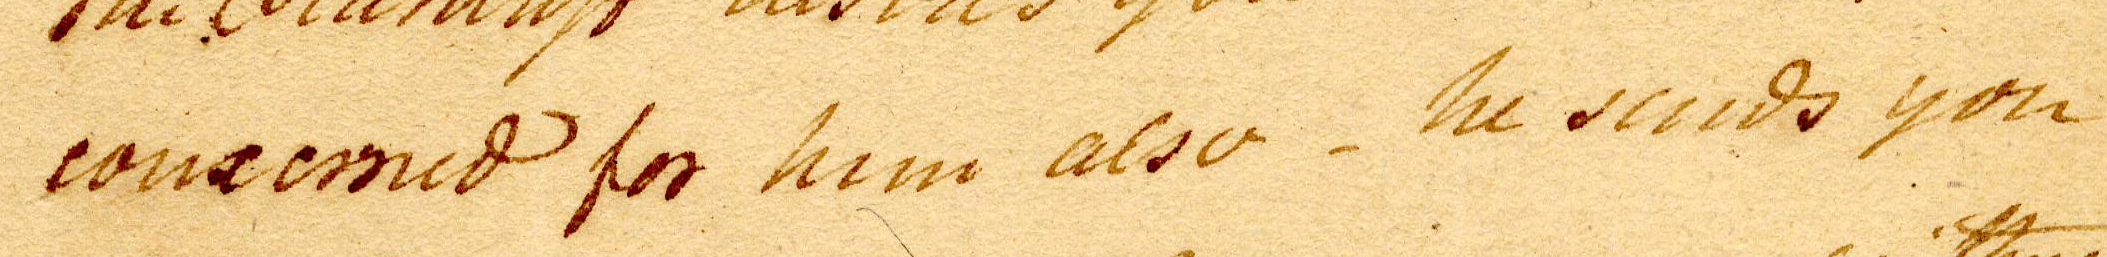concerned for him also. he sends you
